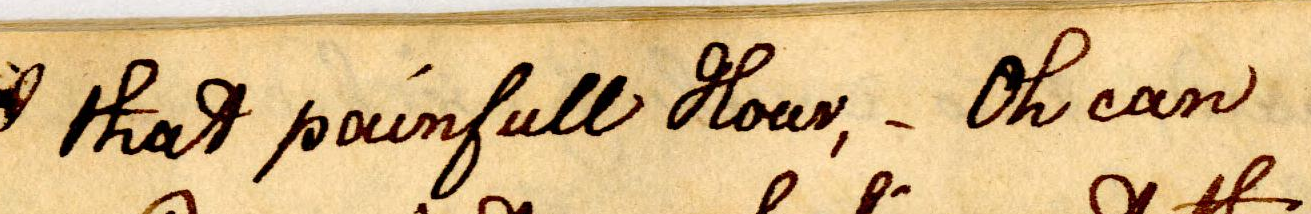that painfull Hour,- Oh can
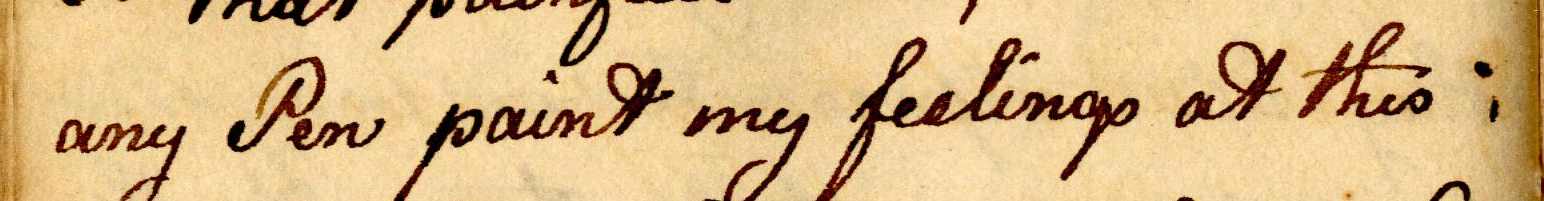any Pen paint my feelings at this
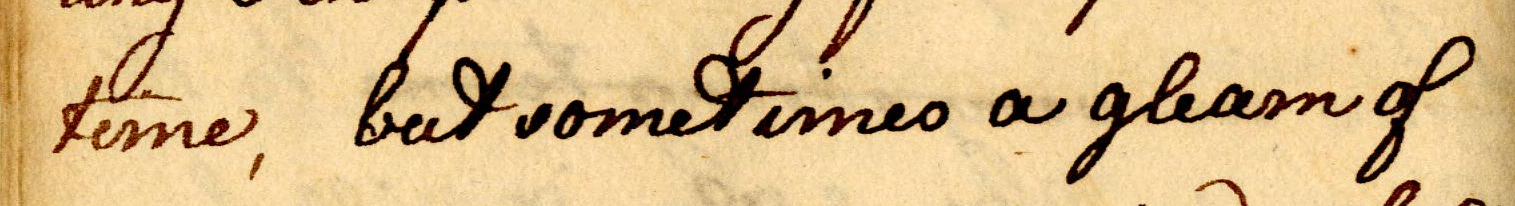time, but sometimes a gleam of
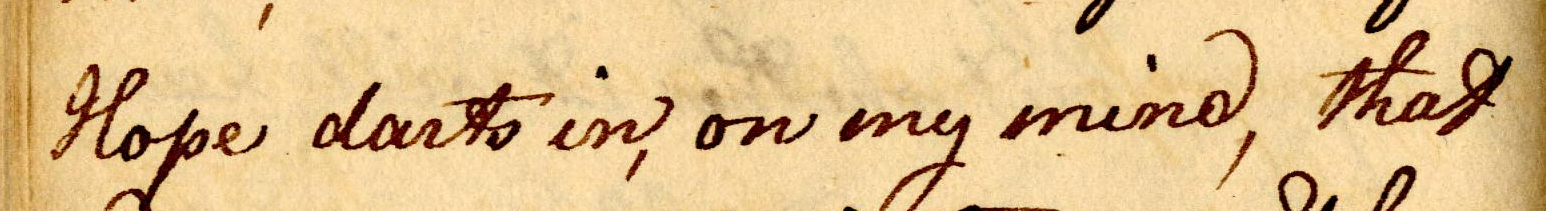Hope darts in, on my mind, that
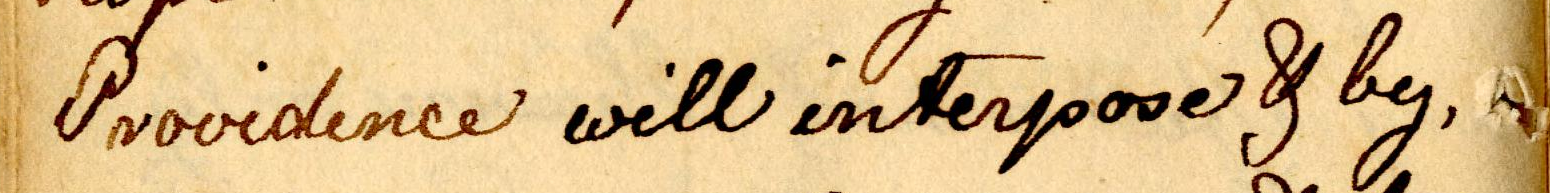Providence will interpose & by,
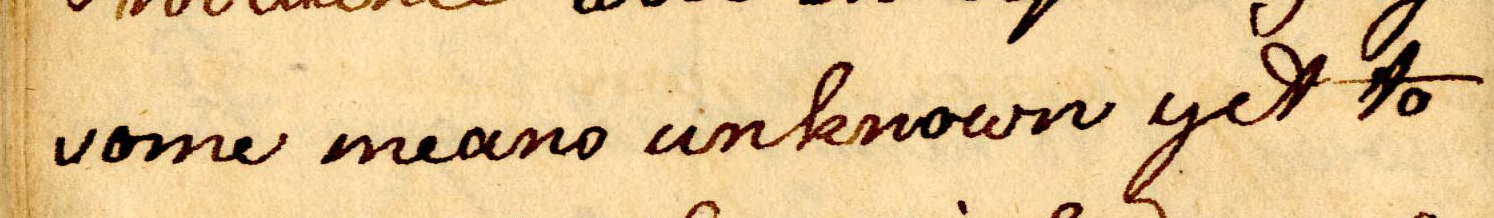some means unknown yet to
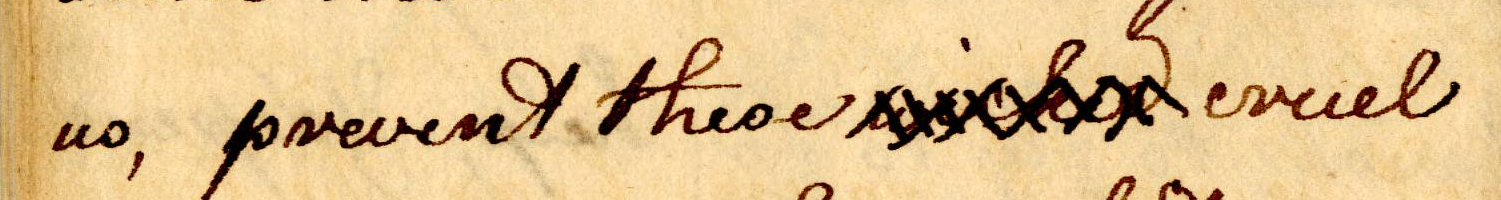us, prevent these [wicked] cruel
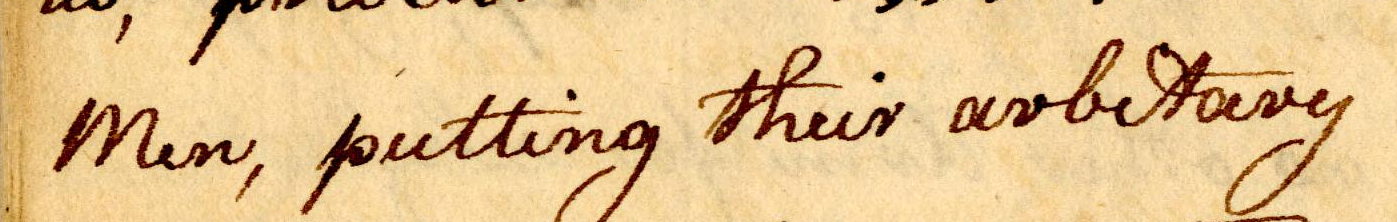Men, putting their arbitary
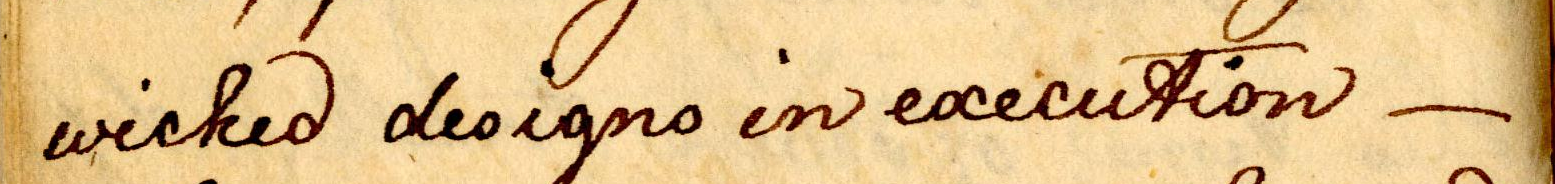wicked designs in execution-
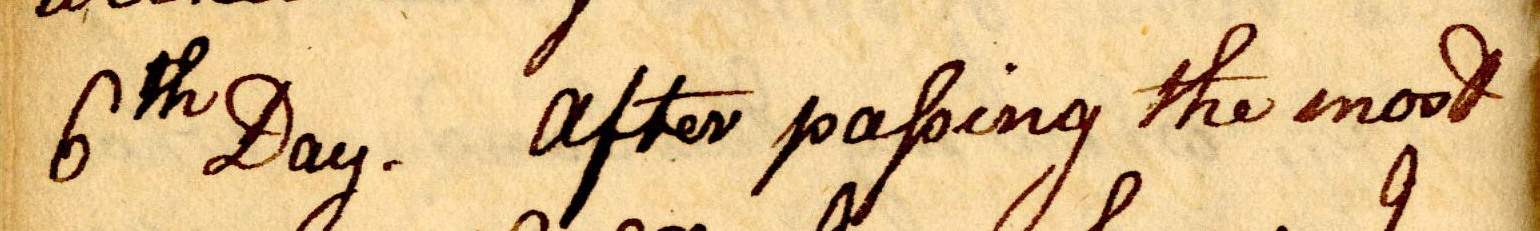6^th Day. After passing the most
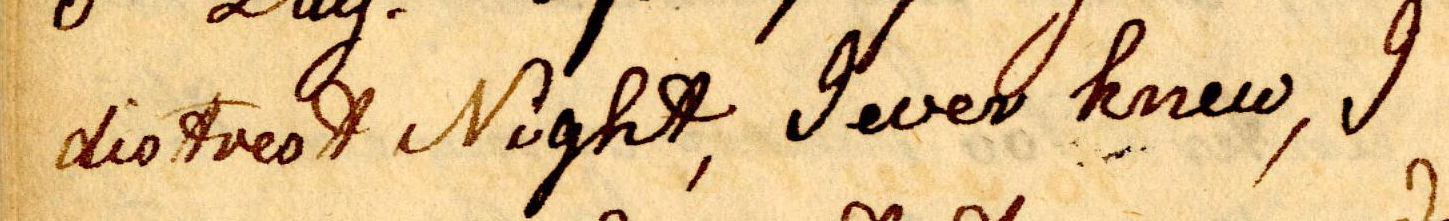distrest Night, I ever knew, I
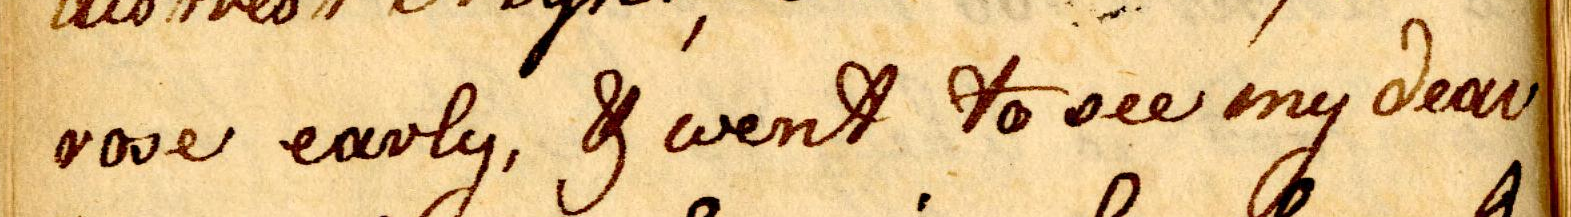rose early, & went to see my dear
